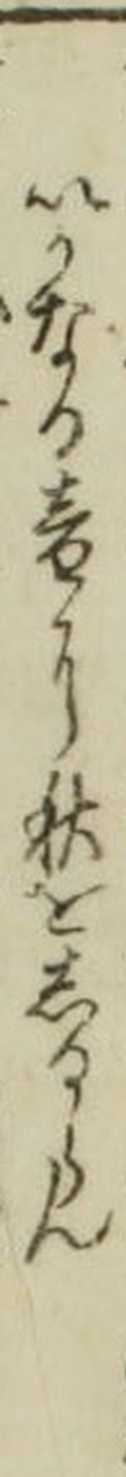いかなる音に秋をしるらん
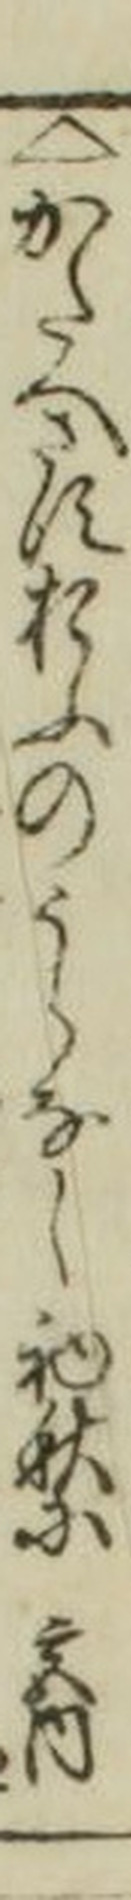△かたへさすおふのうらなし初秋に宮内
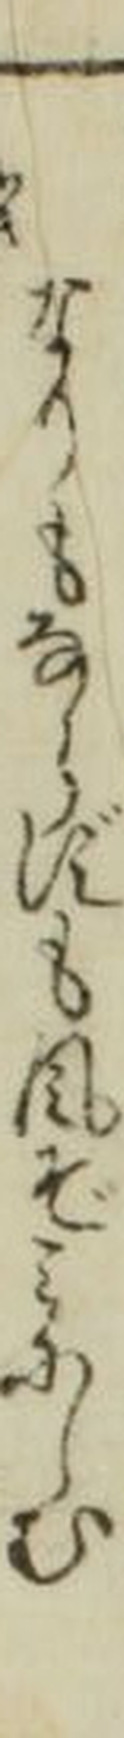なりもならずも風ぞみにしむ卿
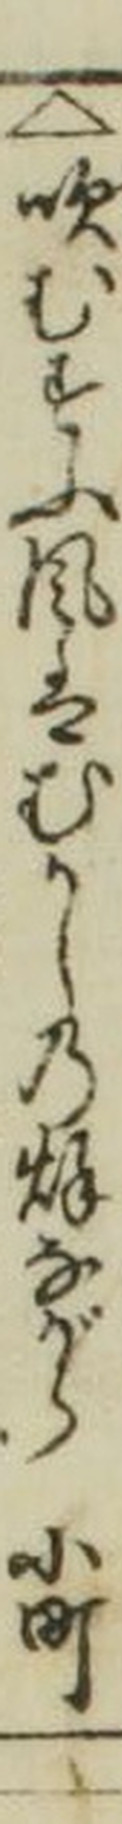△吹むすふ風はむかしの秋ながら小町
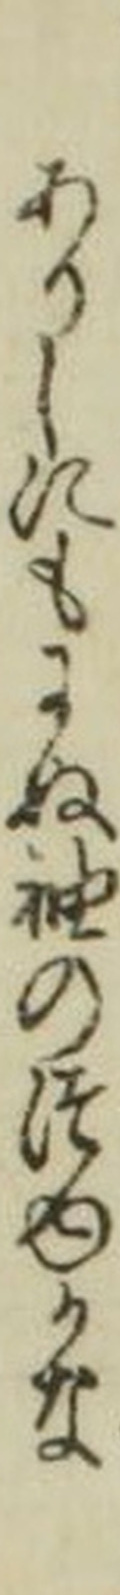ありしにもにぬ袖のつゆかな
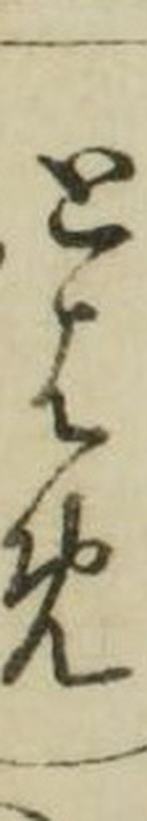とはめ
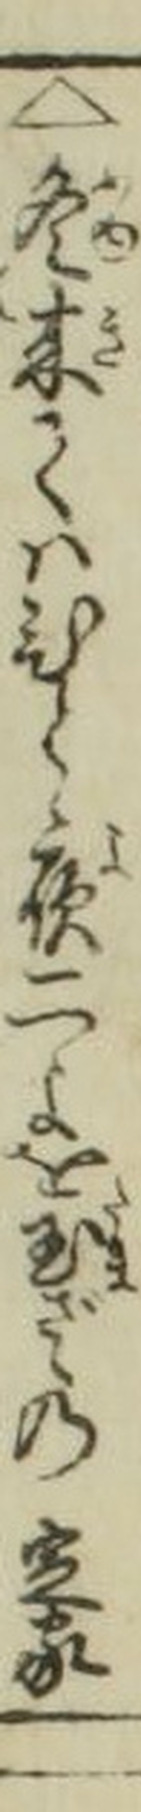△冬来てはひと夜二よを玉ざゝの定家
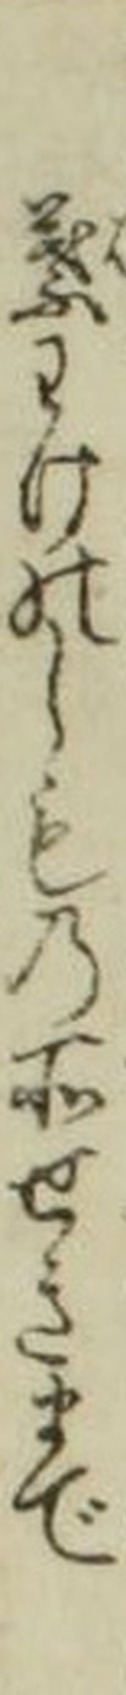葉わけのしもの所せきまで
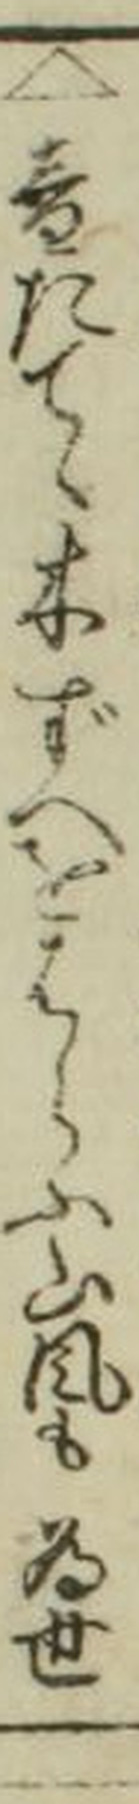△音たてゝ木ずへをはらふ山風も為世
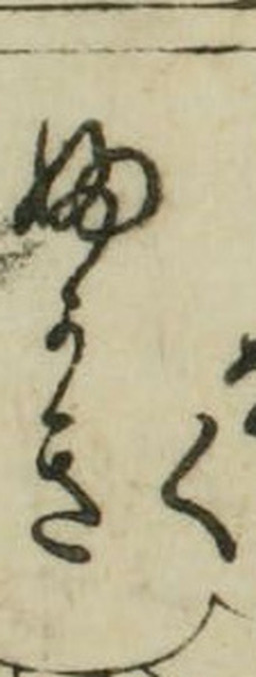ふかき
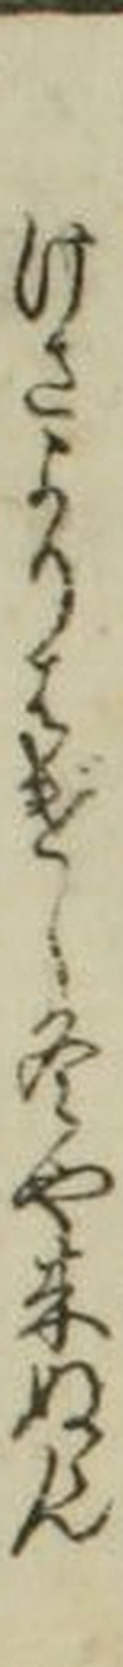けさよりはげし冬や来ぬらん
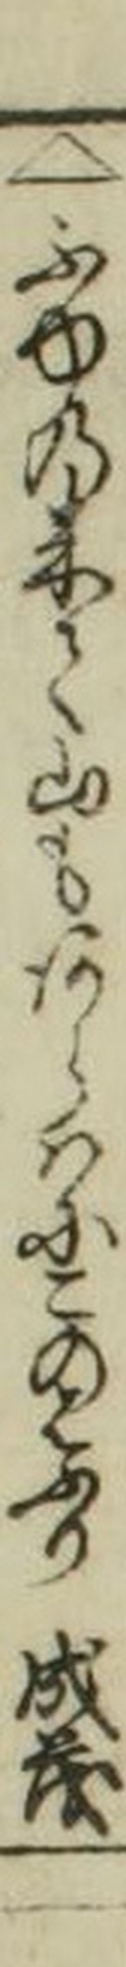△ふゆの来て山もあらはにこのはふり成茂
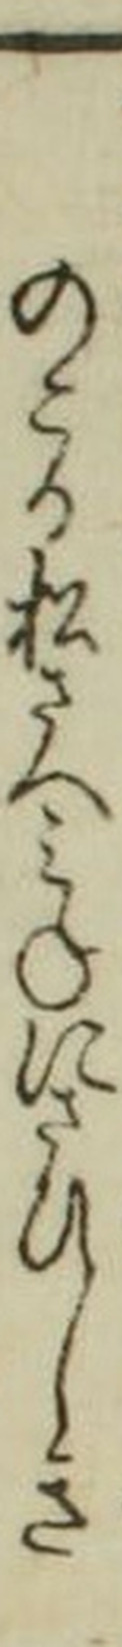のこる松さへみねにさひしき
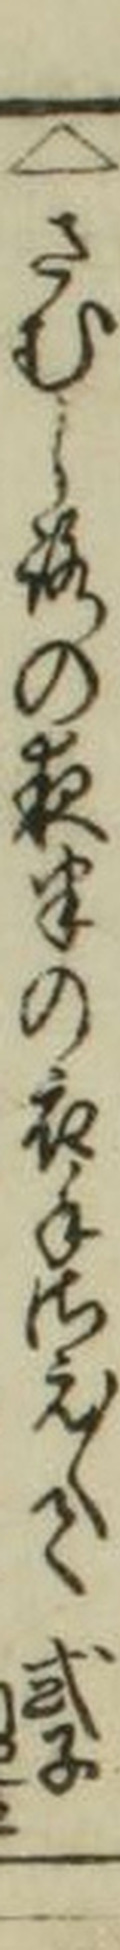△さむしろの夜半の衣手さえ〳〵て式子
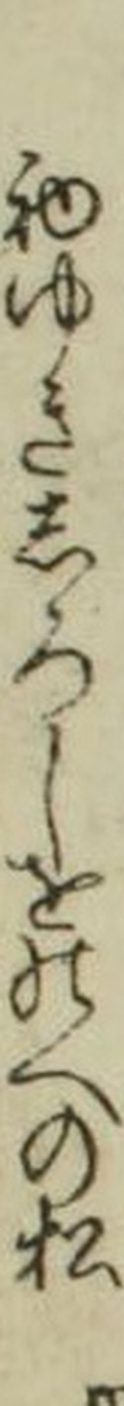初ゆきしろしをのへの松内親王
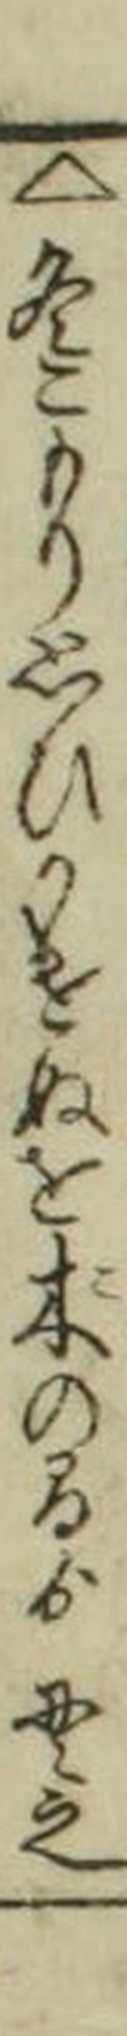△冬こもり思ひかけぬを木の間より貫之
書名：女源氏教訓鑑
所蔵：東京学芸大学附属図書館
